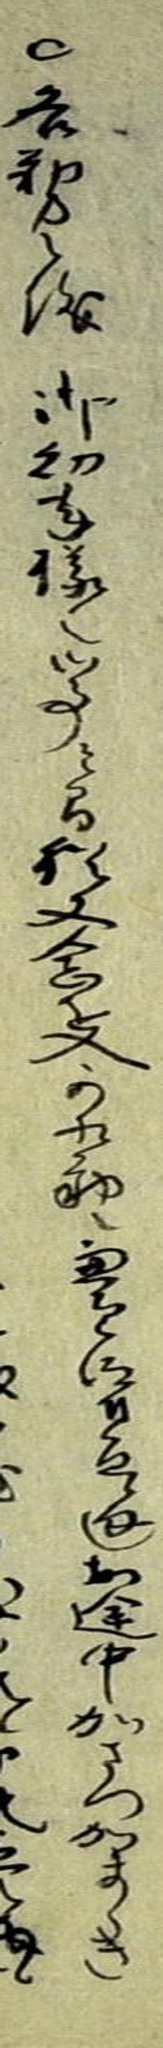〇各勤方之儀御幼年様之御事ニ候間猶又念を入可相勤候兼而被仰付置候通於途中かさつかましき
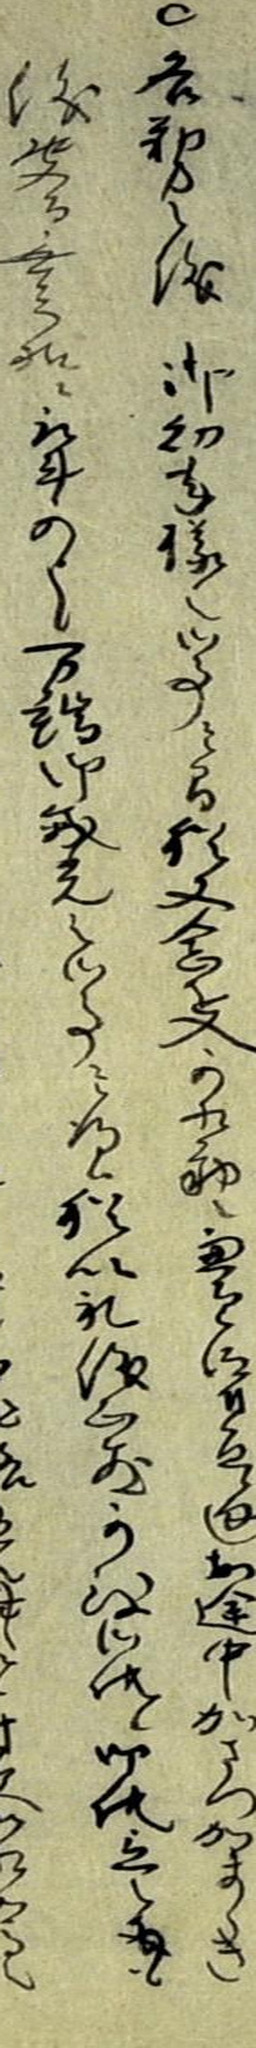儀決而無之様ニ取計可申候万端御威光之御事ニ候得ハ猶以礼儀正敷可致御供候御供立之義も
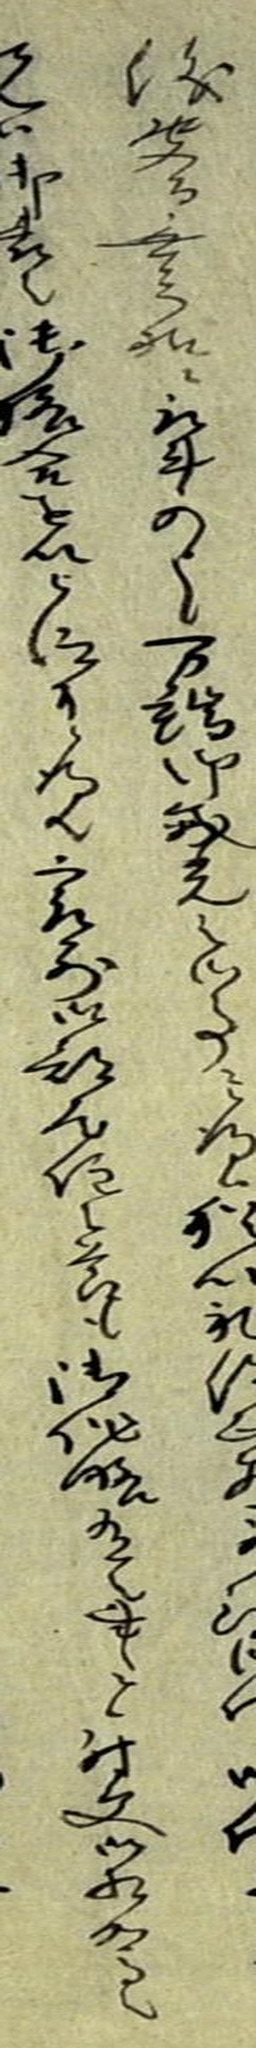先ハ御表之御格合を以被仰付候得共最前御部屋住之節も御作略有之事ニ候殊更御相駕之
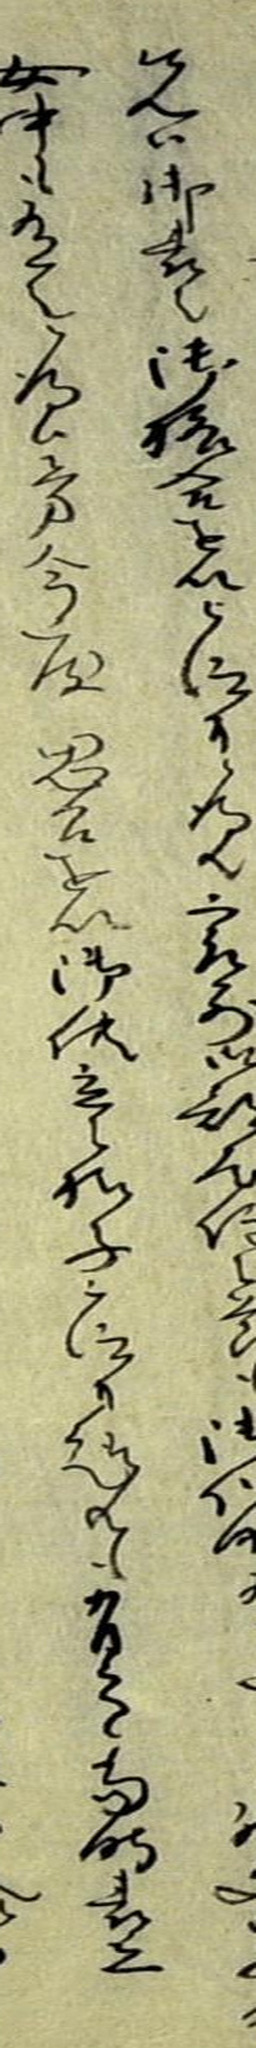女中も有之候得ハ旁今度思召を以御供立之様子被仰付趣共も有之候当時表立
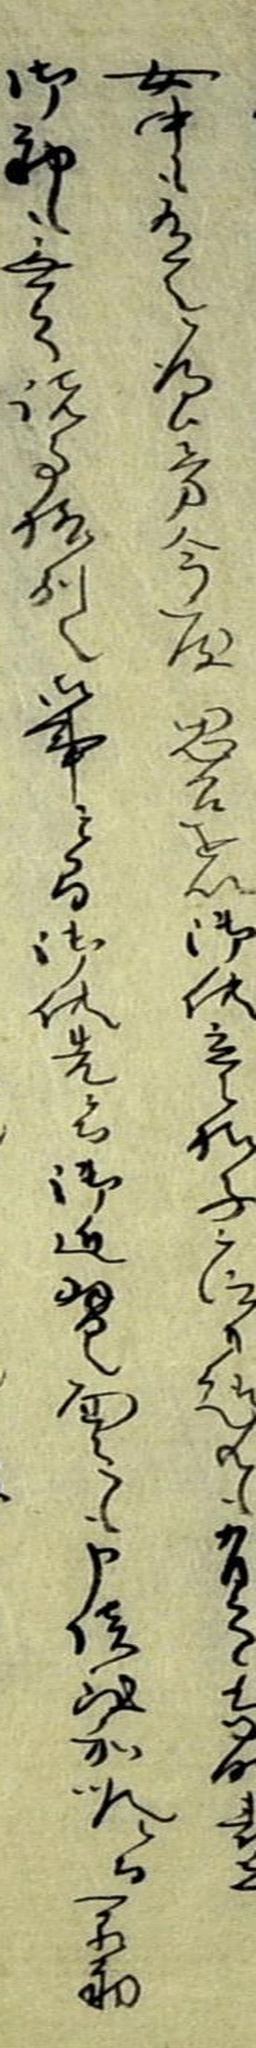御勤も無之諸事格別之御事ニ候間御供先ニ而御近習之面々へも申談致和順候而可相勤
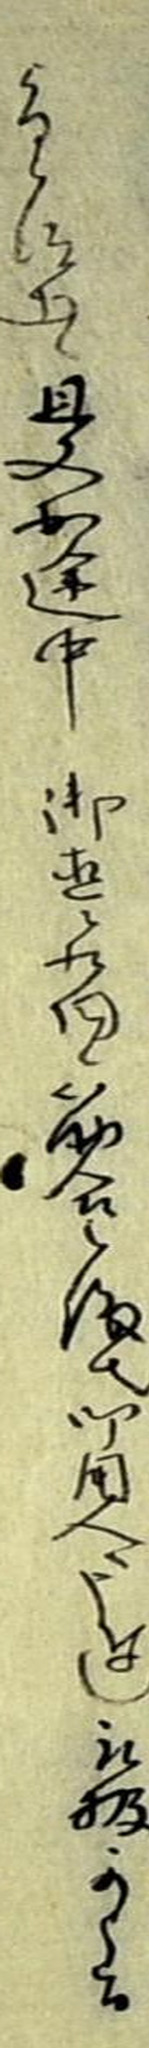旨被仰出候且又於途中御直ニ相伺候筋合之儀者御用人へ申達取扱可申旨
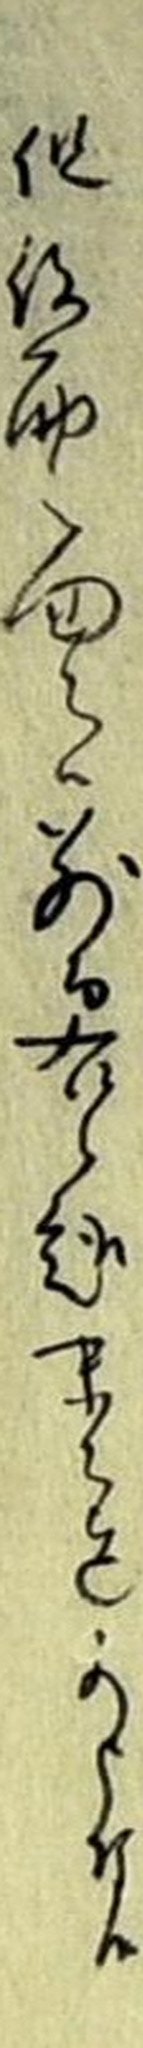但役筋之面々ハ別而右之趣末々迄可申付候
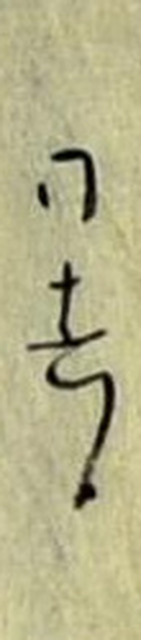同十六日

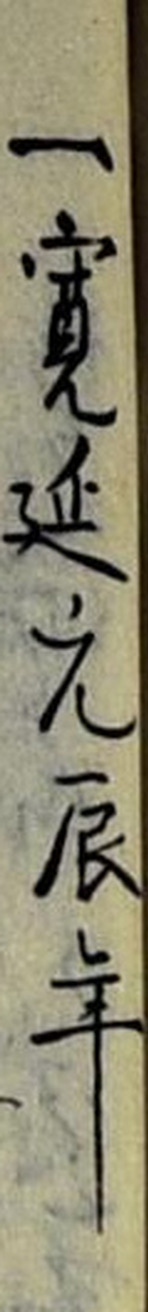一寛延元辰年
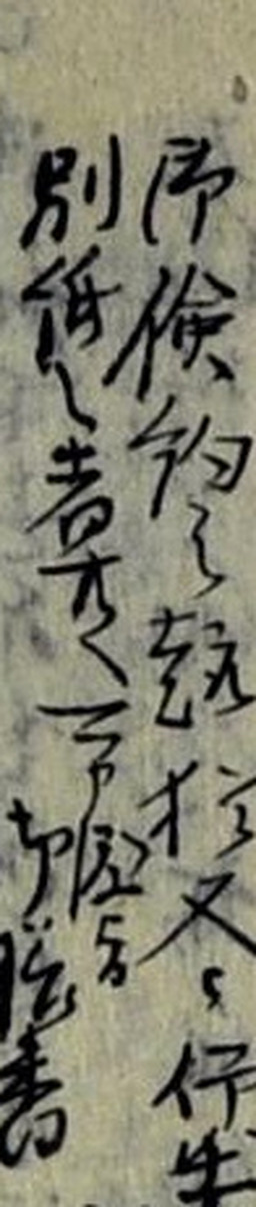別紙之者共へ可申渡旨別紙書付
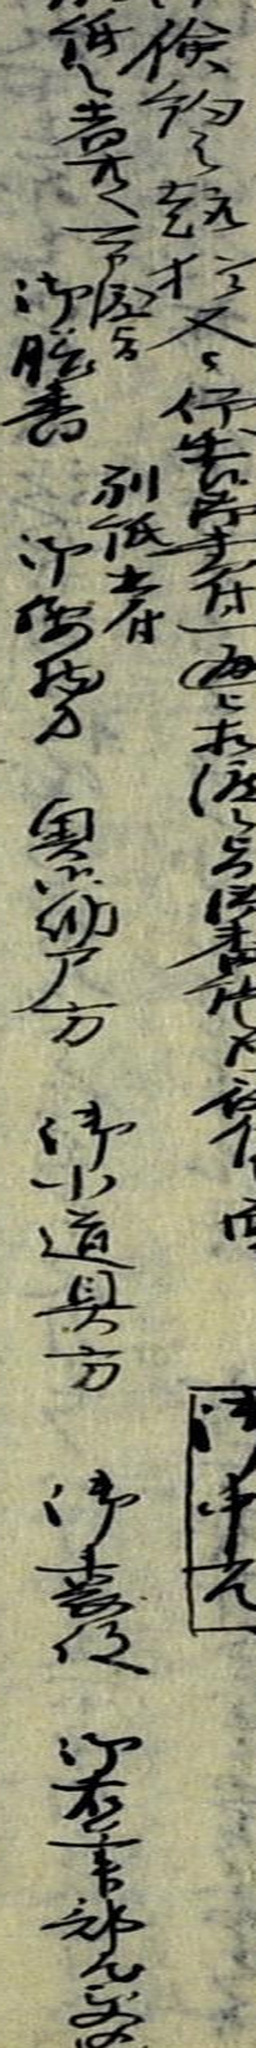御膳番御腰物方奥御納戸方御小道具方御裏役御右筆部屋受込
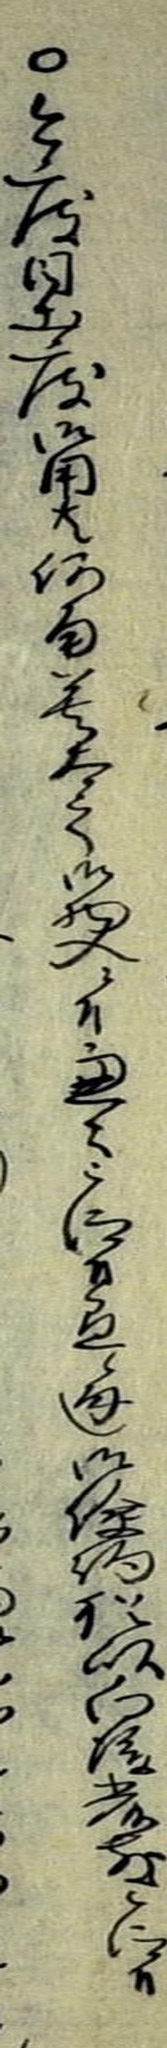〇今度目出度御用共何角莫太之御物入ニ付兼々被仰付置候通御倹約猶以向後厳敷被仰付
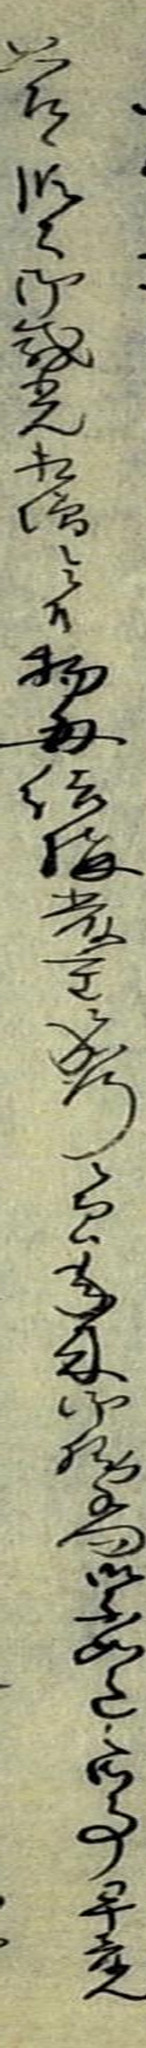思召候段々御威光相増候ニ付物毎結構厳重ニ成行候而ハ年来御勝手向御不如意之御事畢竟
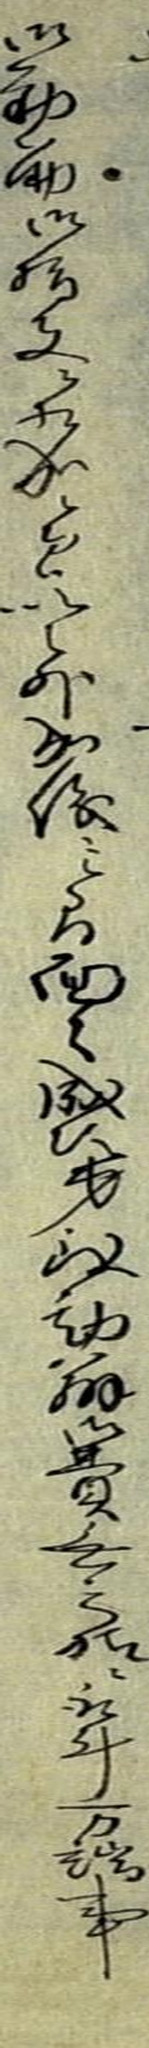御勤筋御指支ニ相成候而ハ以之外成儀ニ候間面々成次第致勘弁御費無之様ニ取計万端事
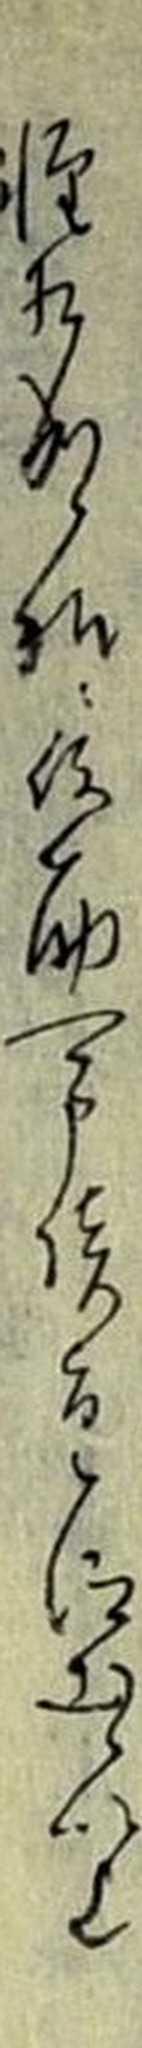軽相成候様ニ役筋可申談旨被仰出候以上
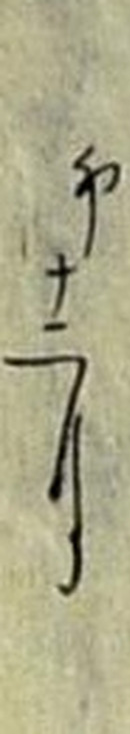卯十二月
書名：命令之部 一
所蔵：福井県文書館 Fukui Prefectural Archives
